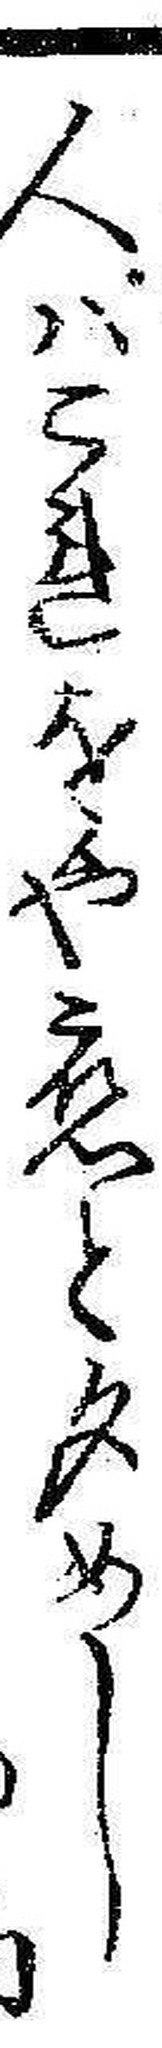人はこれをや恋と夕めし
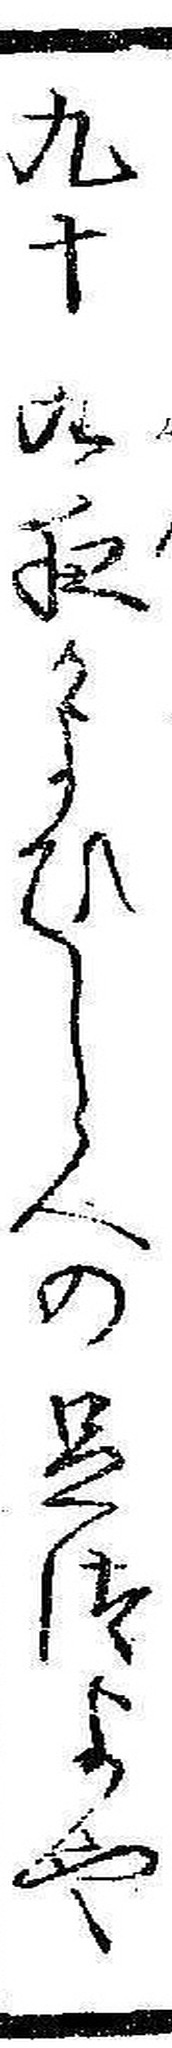九十九夜かよひし人の足つよや

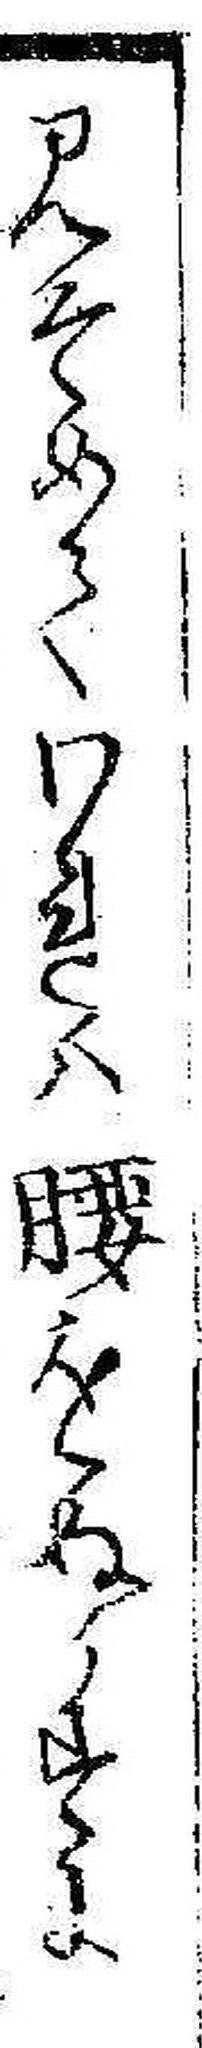見そめてわれは腰をぬかすに
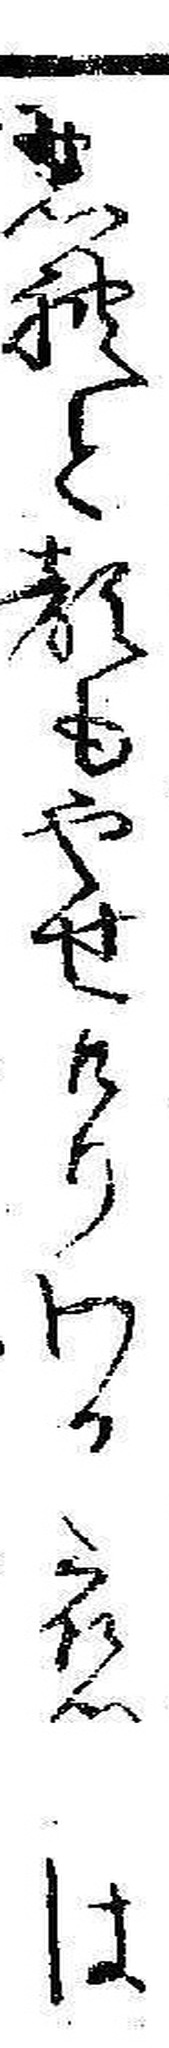忍れと顔もやせけりわか恋は
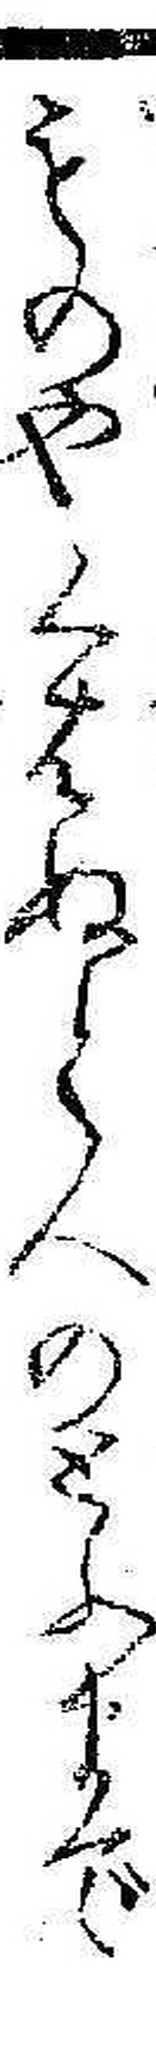ものやくはぬと人のとふまで
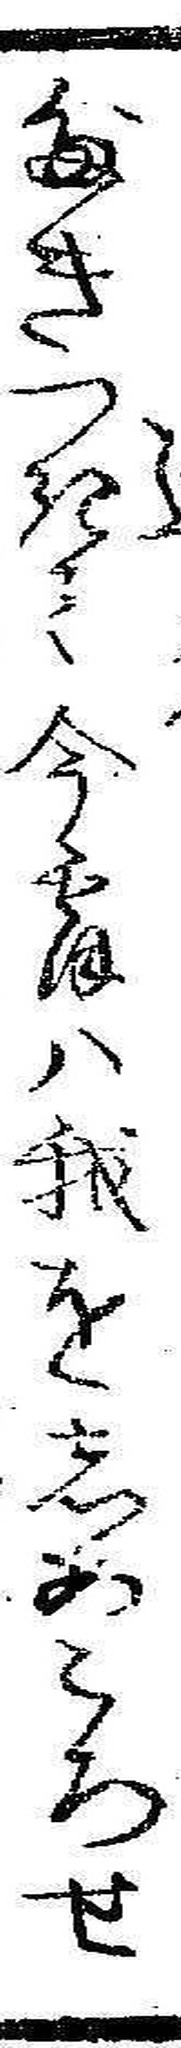だきつきて今宵は我をしめころせ
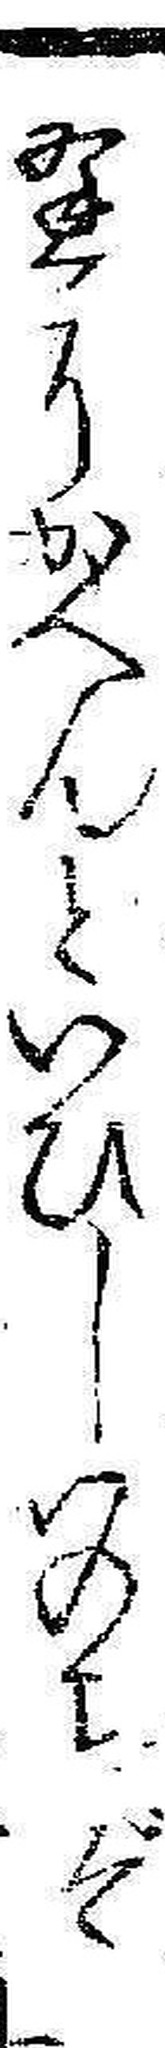逢かへんといひしいのちぞ
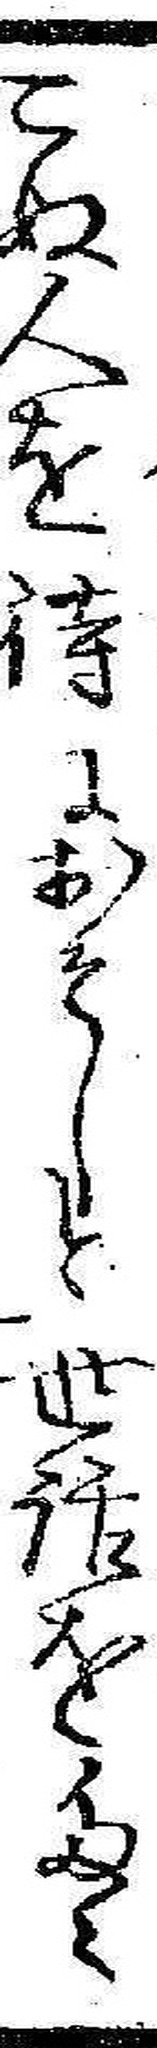こぬ人を待におそしと世話をたゝ
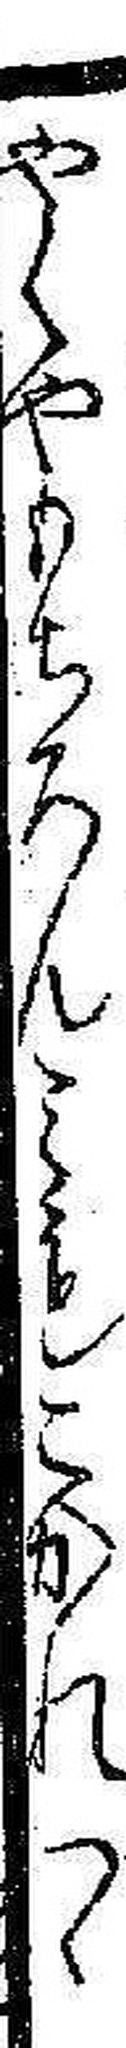やくやもちろんみもこかれつゝ
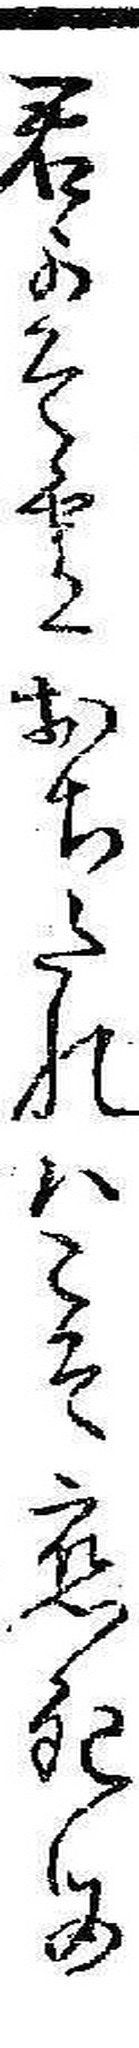君のおちたれはこそ恋死め
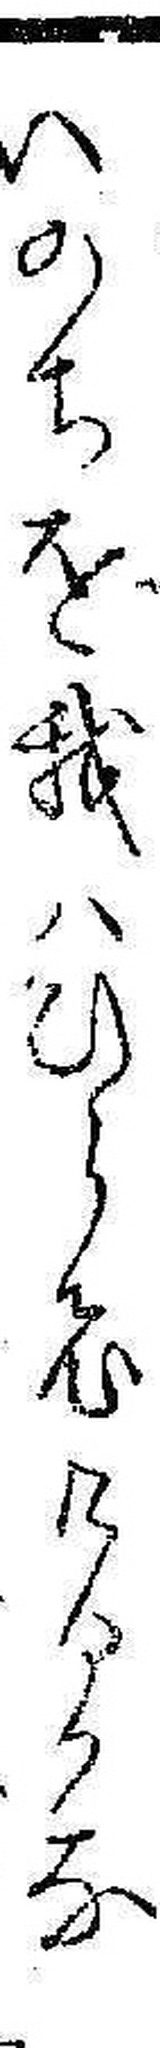いのちを我はひらけるかな
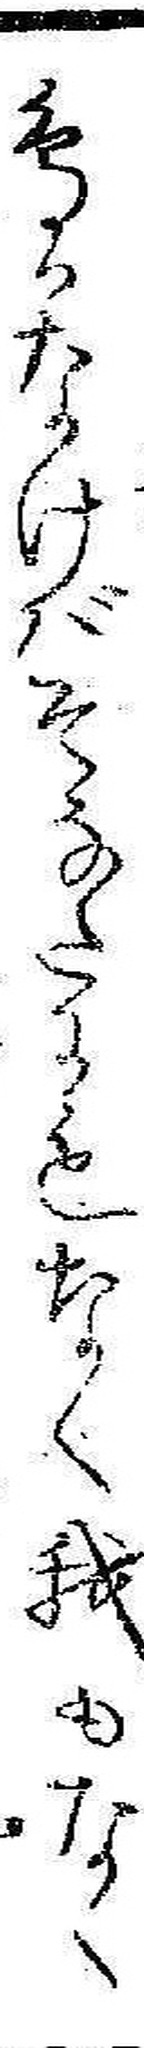鳥かなけばそなたもなく我もなく
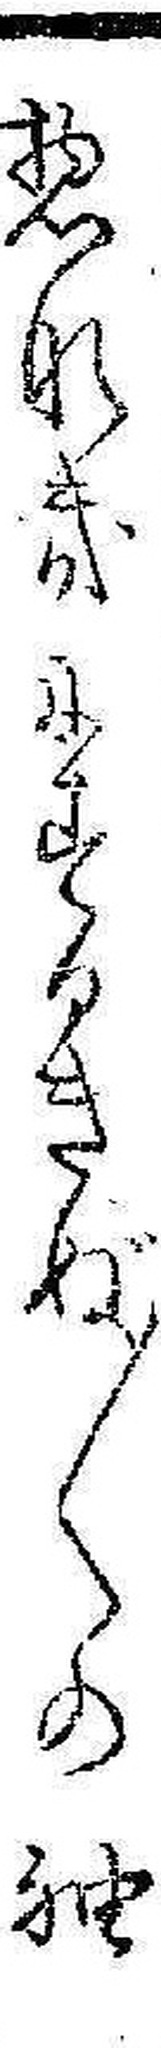なきにするきぬ〳〵の袖
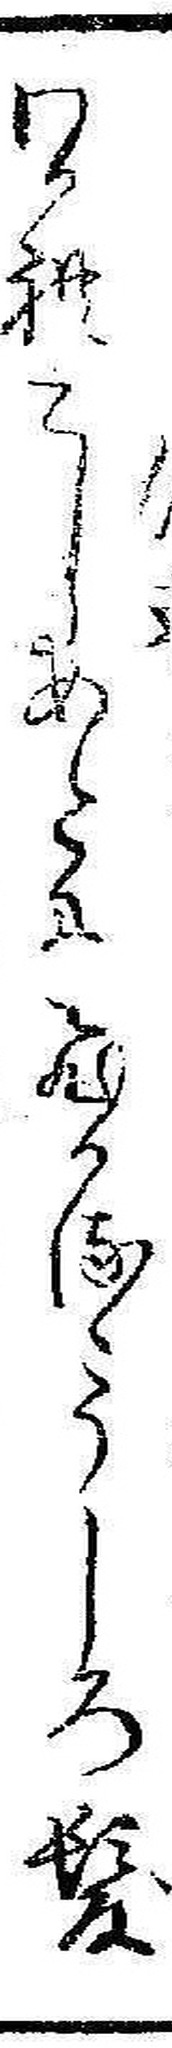わかれこしあとにひかるゝうしろ髪
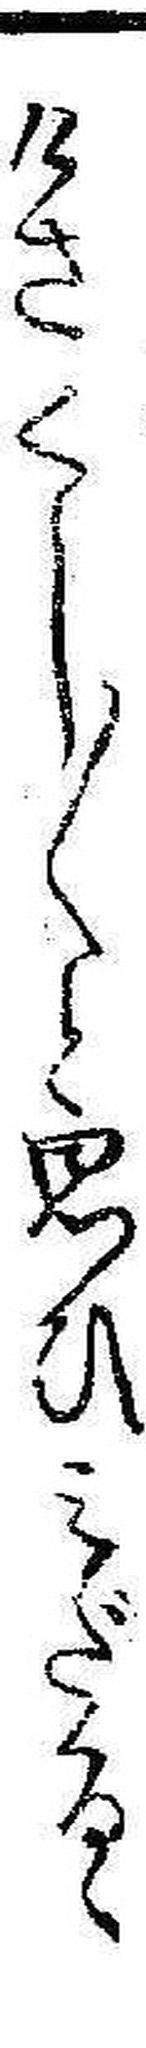けさくし〳〵と思ひみだるゝ
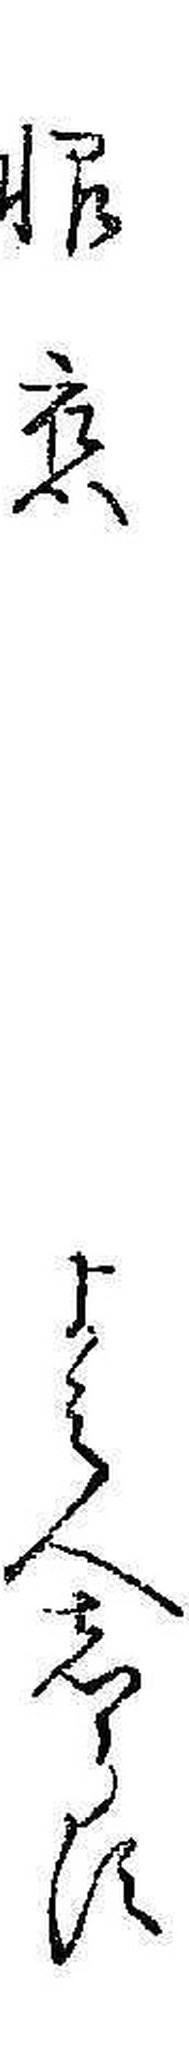恨恋よみ人しらす
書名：狂哥はまのきさご
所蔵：国文学研究資料館
